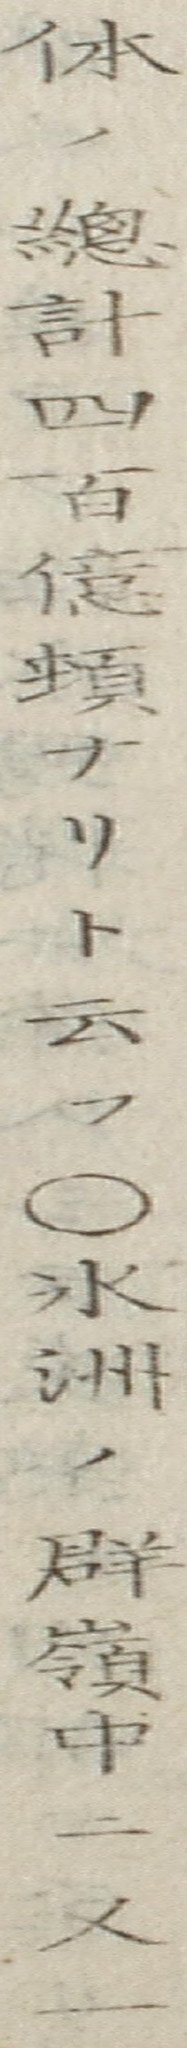体ノ総計四百億頓ナリト云フ○氷洲ノ群嶺中ニ又一
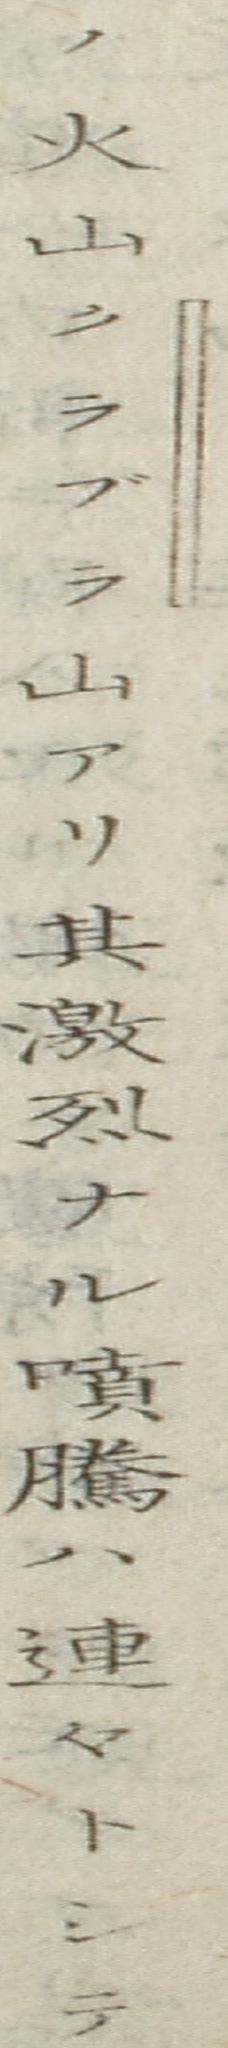ノ火山クラブラ山アリ其激烈ナル噴騰ハ連々トシテ
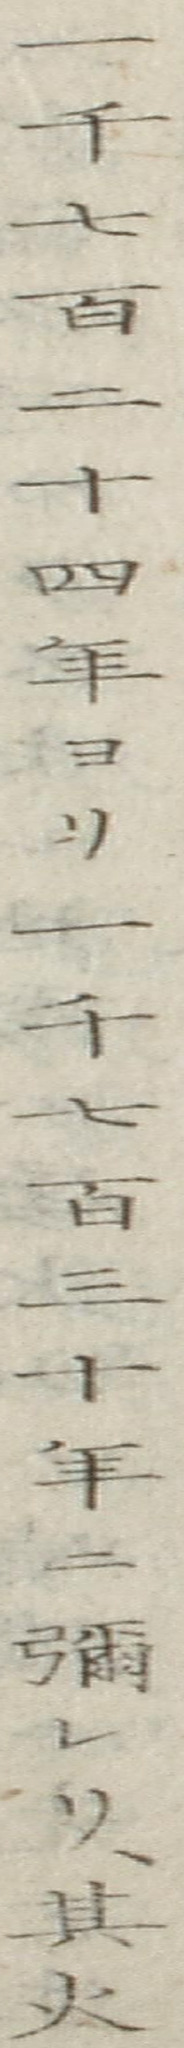一千七百二十四年ヨリ一千七百三十年ニ彌レリ、其火
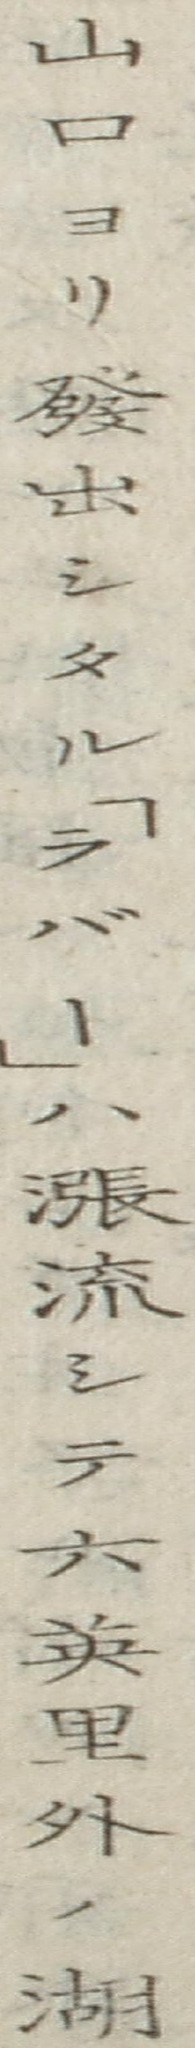山口ヨリ発出シタル「ラバー」ハ漲流シテ六英里外ノ湖
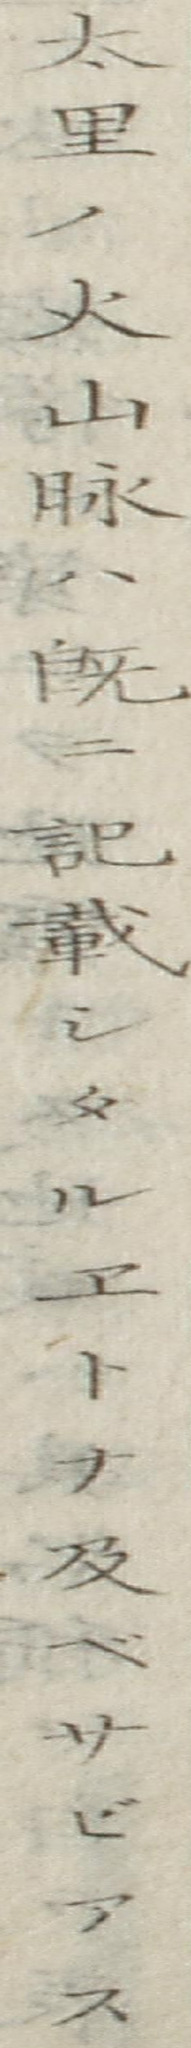太里ノ火山脈ハ既ニ記載シタルヱトナ及ベサビアス
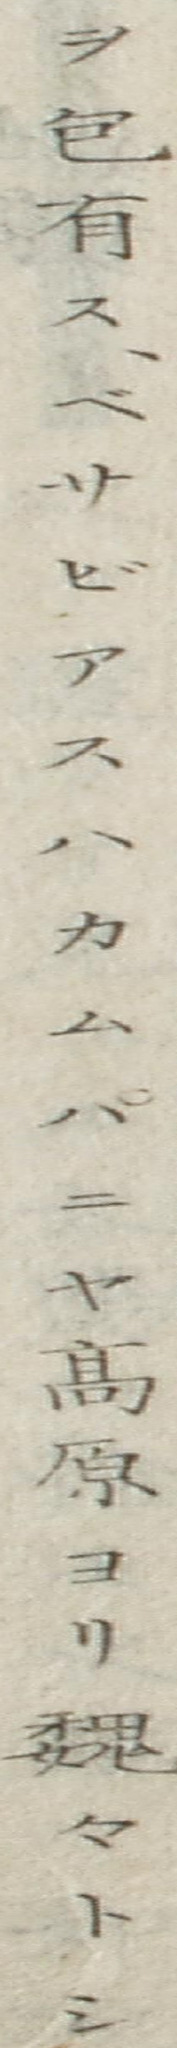ヲ包有ス、ベサビアスハカムパニヤ高原ヨリ魏々トシ
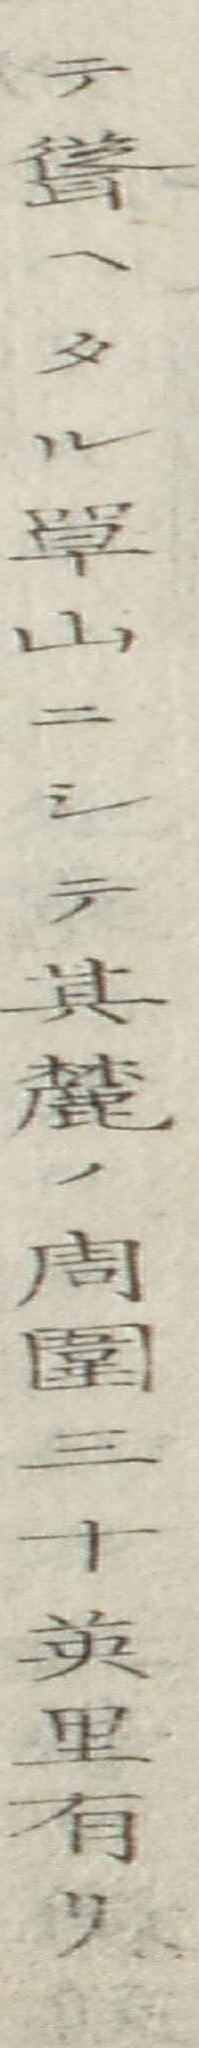テ聳ヘタル単山ニシテ其麓ノ周囲三十英里有リ
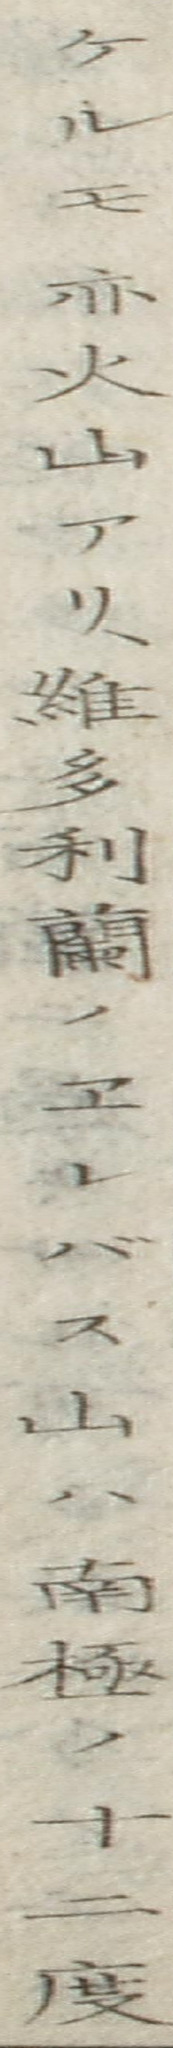ケルモ亦火山アリ、維多利蘭ノヱレバス山ハ南極ノ十二度
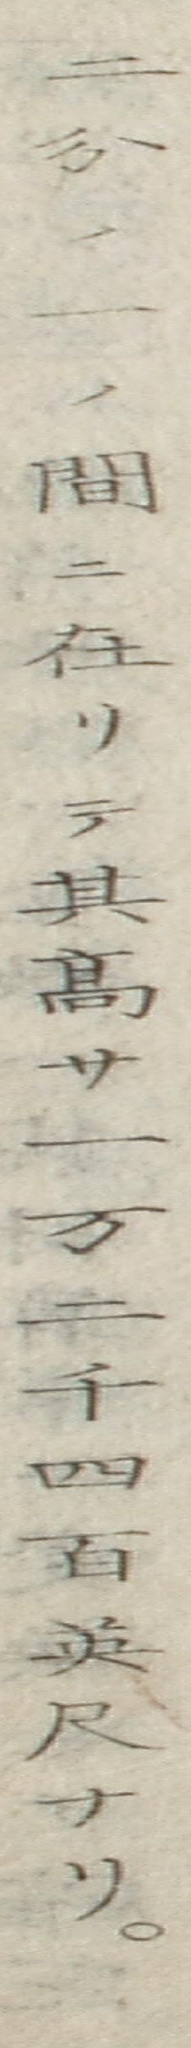二分ノ一ノ間ニ在リテ其高サ一万二千四百英尺ナリ。

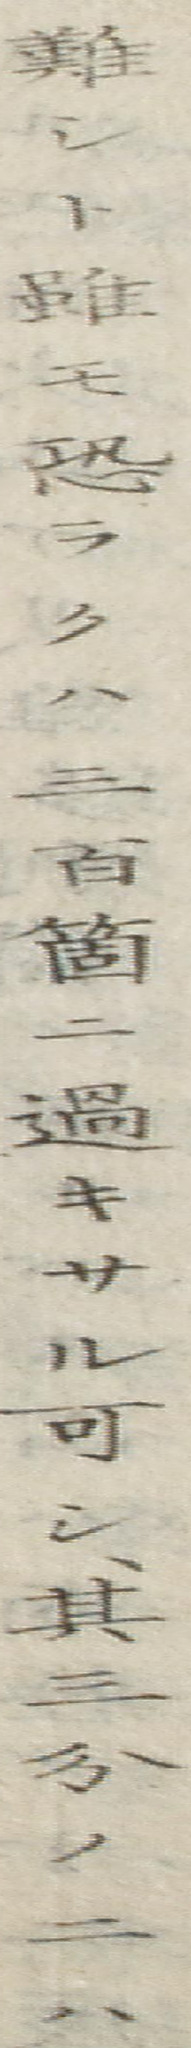難シト雖モ恐ラクハ三百箇ニ過キサル可シ、其三分ノ二ハ
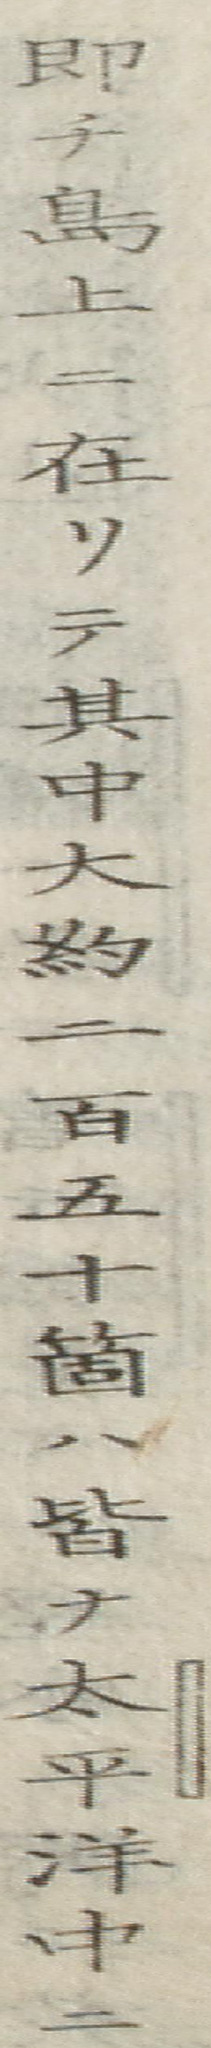即チ島上ニ在リテ其中大約二百五十箇ハ皆ナ太平洋中ニ
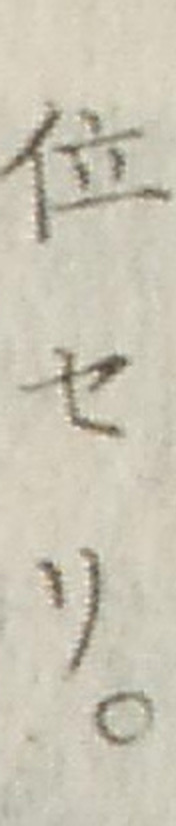位セリ。
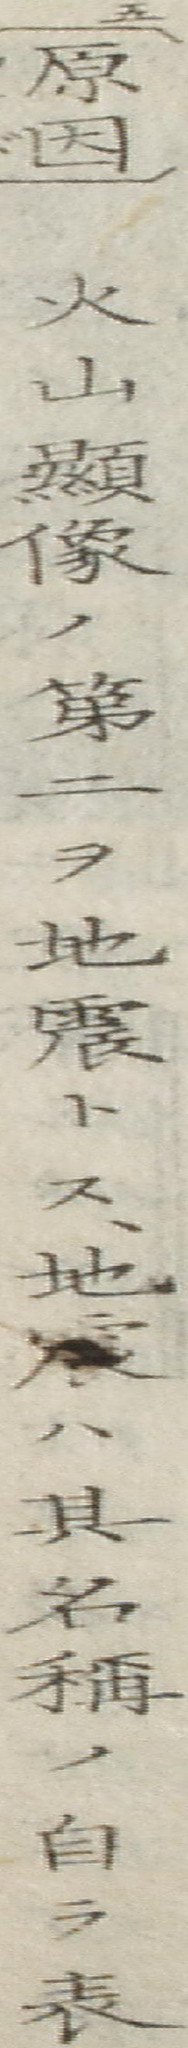廿五[原因]火山顕像ノ第二ヲ地震トス、地震は其名称ノ自ラ表
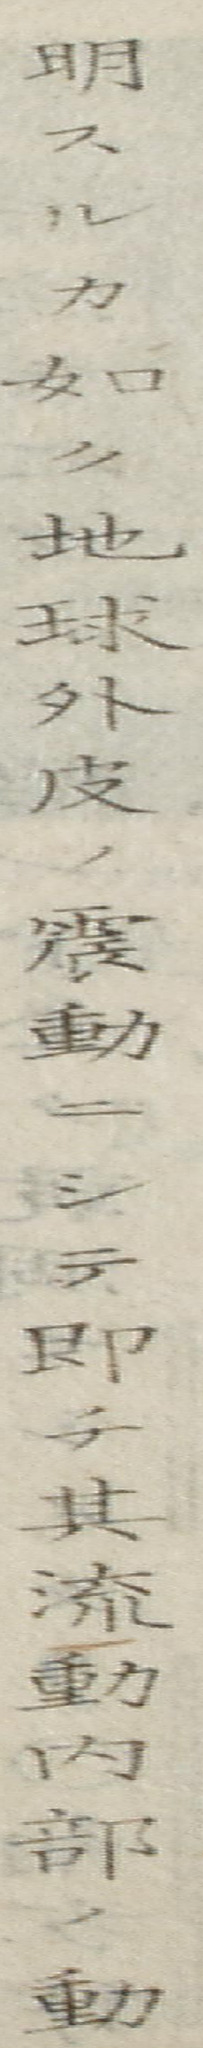明スルカ如ク地球外皮ノ震動ニシテ即チ其流動内部ノ動
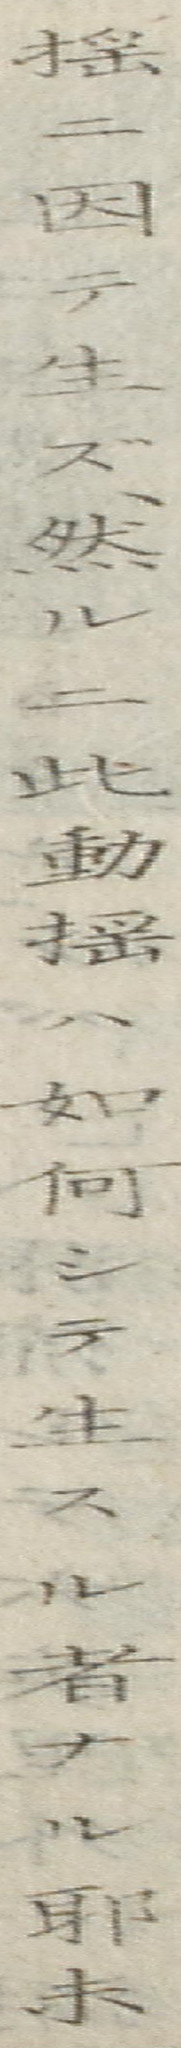揺ニ因テ生ズ、然ルニ此動揺如何シテ生スル者ナル耶未
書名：地形論　巻二
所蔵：東京大学地震研究所図書室 Earthquake Research Institute Library, The University of Tokyo, JAPAN
